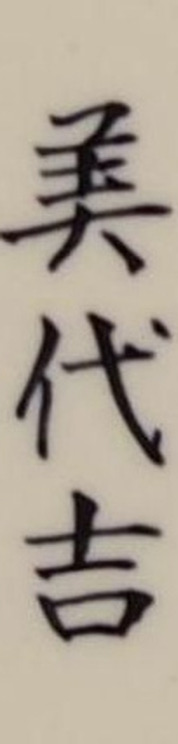美代吉
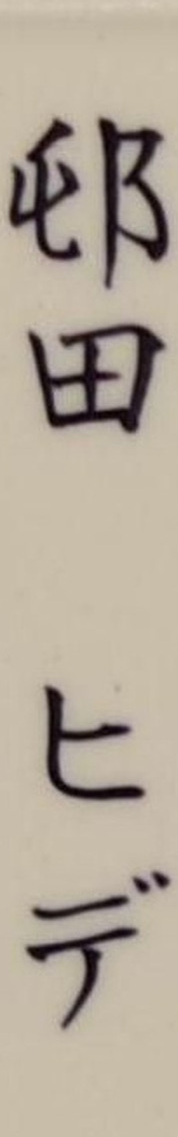邨田ヒデ
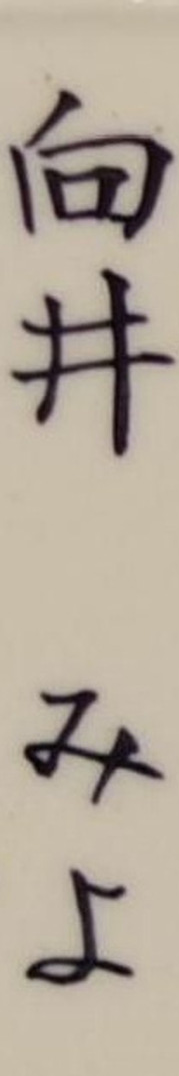向井みよ
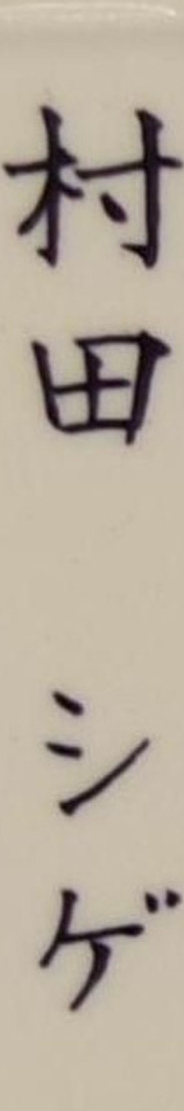村田シゲ

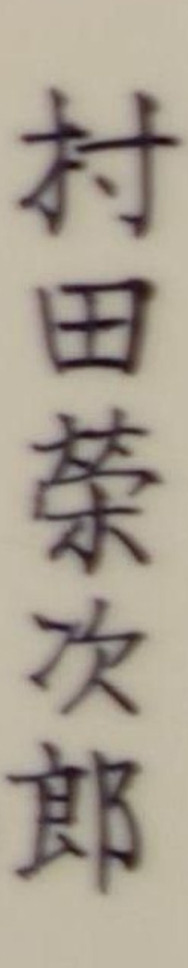村田栄次郎
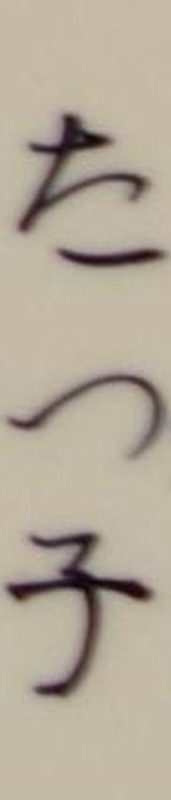たつ子
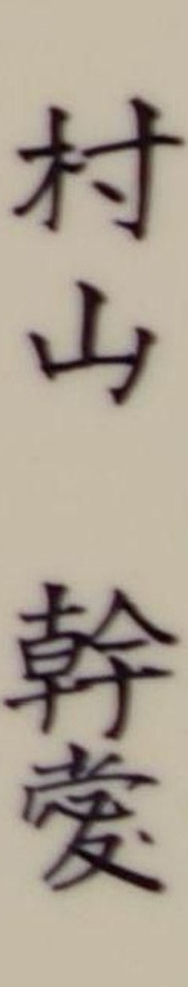村山幹愛
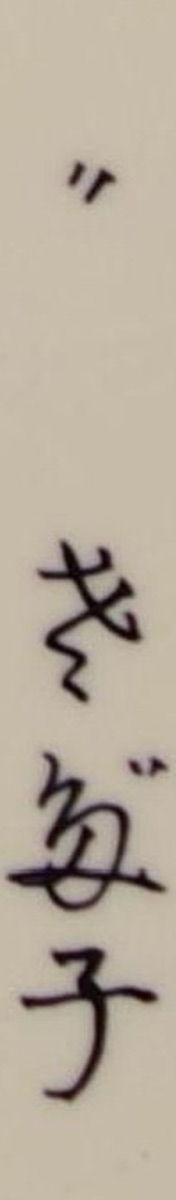さだ子
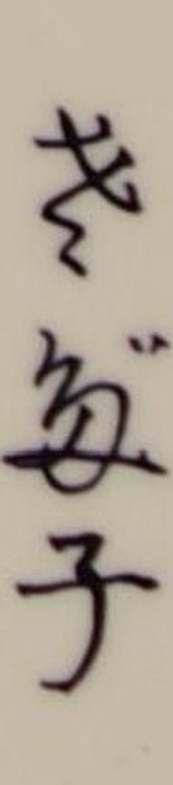さだ子
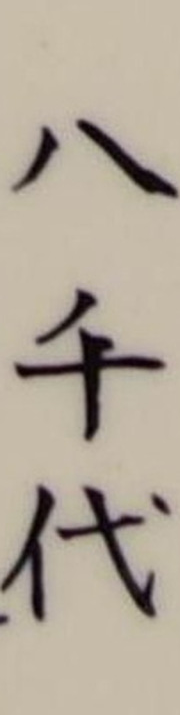八千代
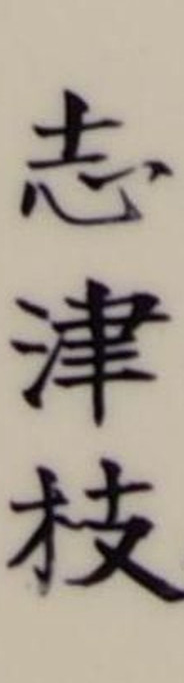志津枝
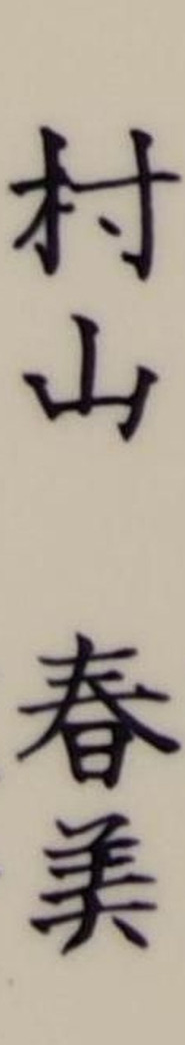村山春美
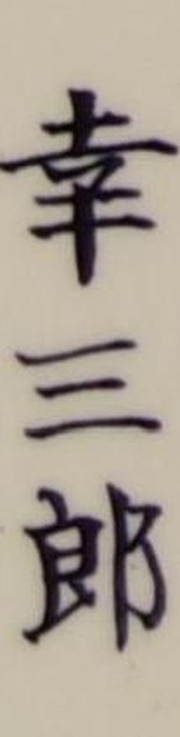幸三郎

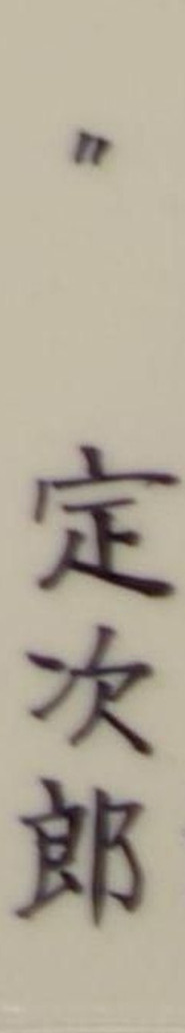定次郎
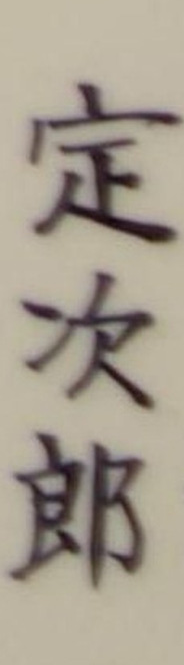定次郎
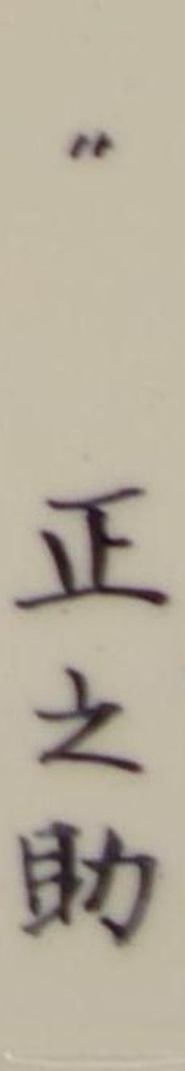正之助
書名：M~S
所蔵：高野山金剛峯寺
